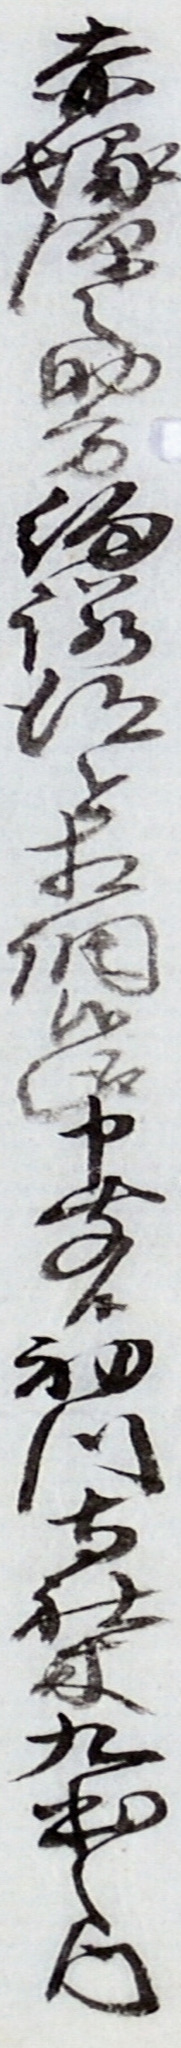赤塚源之助方偏路得と相調候趣申聞候初川寺社木九本之内
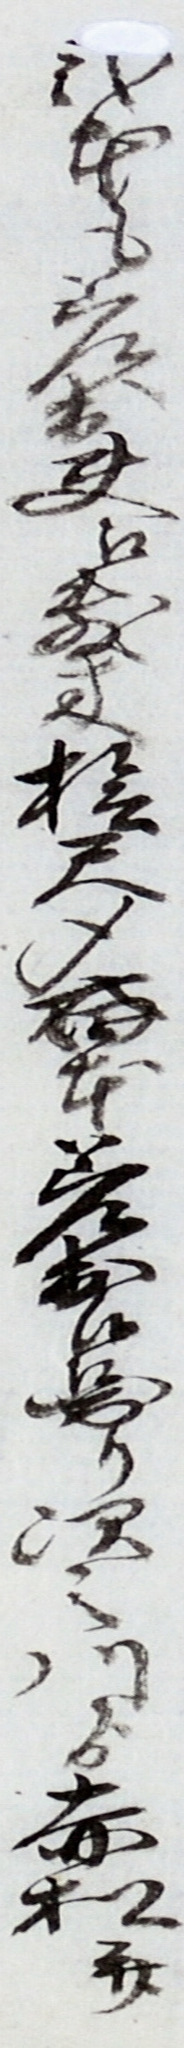弐本も差出夫江敷木横尺〆本差出候図り次之川より赤松并
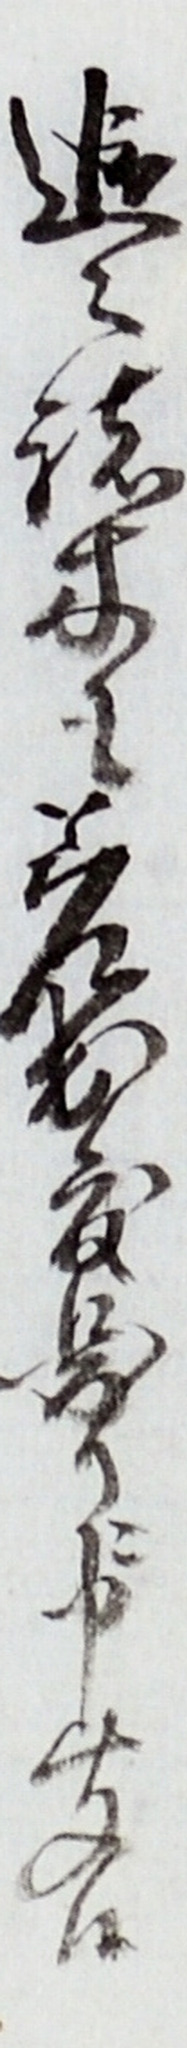追々諸木も差出度図りニ申聞候
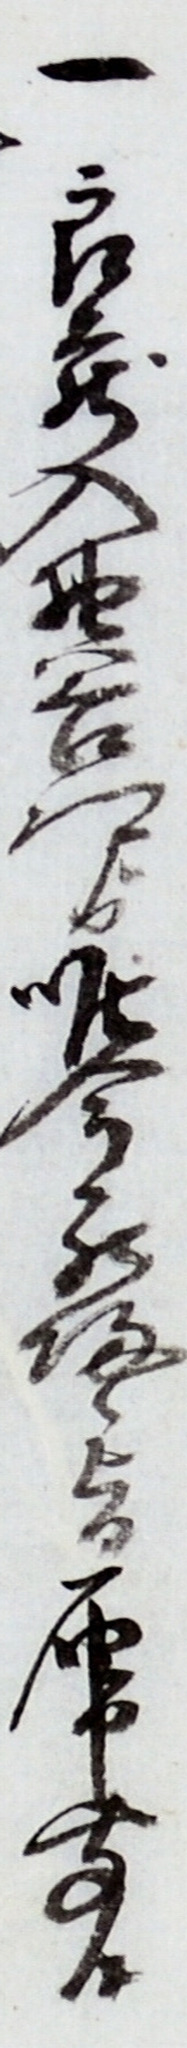一良蔵入野谷郷より昨今罷帰候旨届申聞候
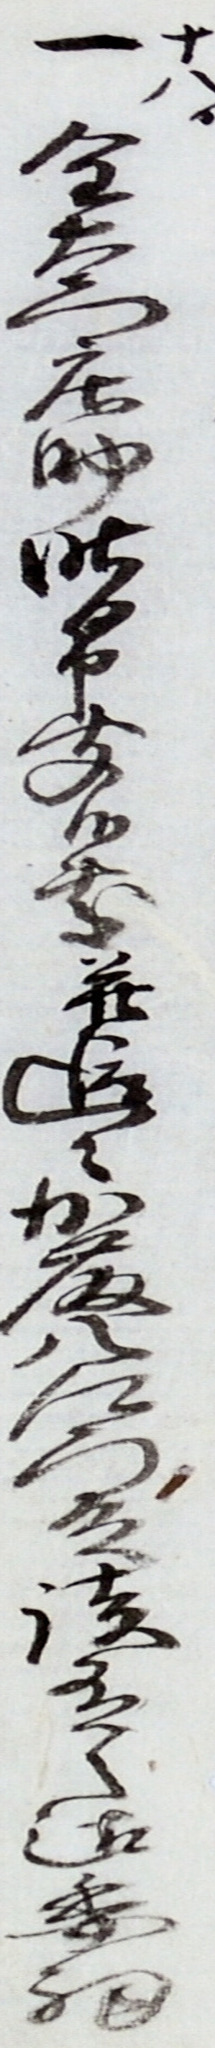一金右衛門庄助昨日申聞候処并追々加藤八左衛門殿請置候趣委細
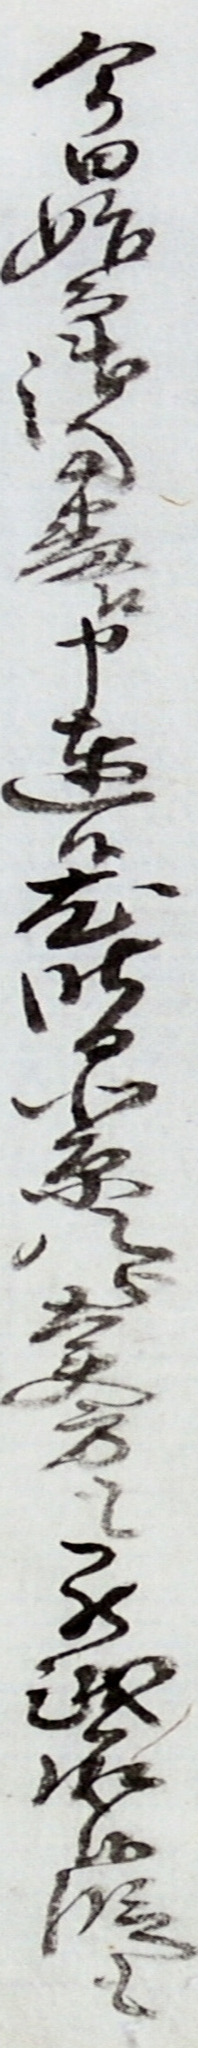今日始而御用番江申達候尤昨日北原八郎方も罷越居候段も
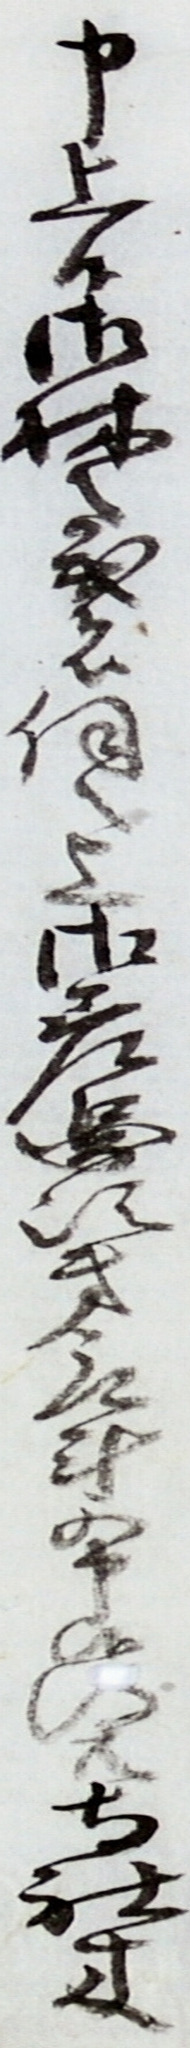申上候御林之義は伺之上御差図次第取計可申候得共寺社木
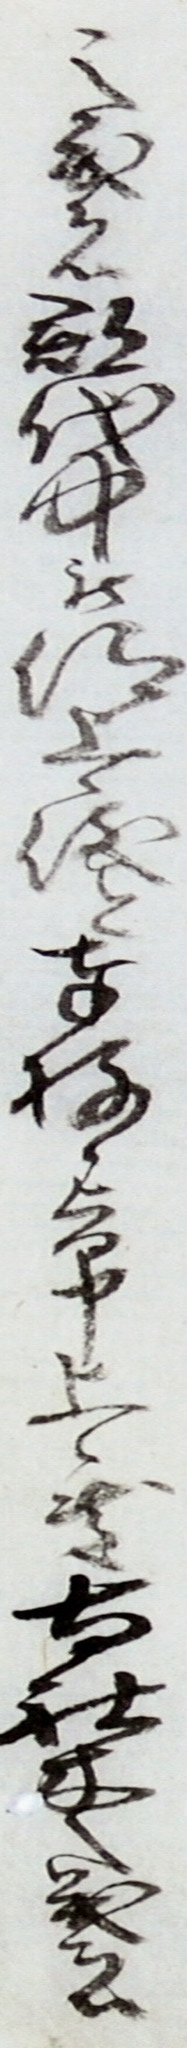之義は郡代中被仰上候儀と奉存候旨申上候処寺社木之義は
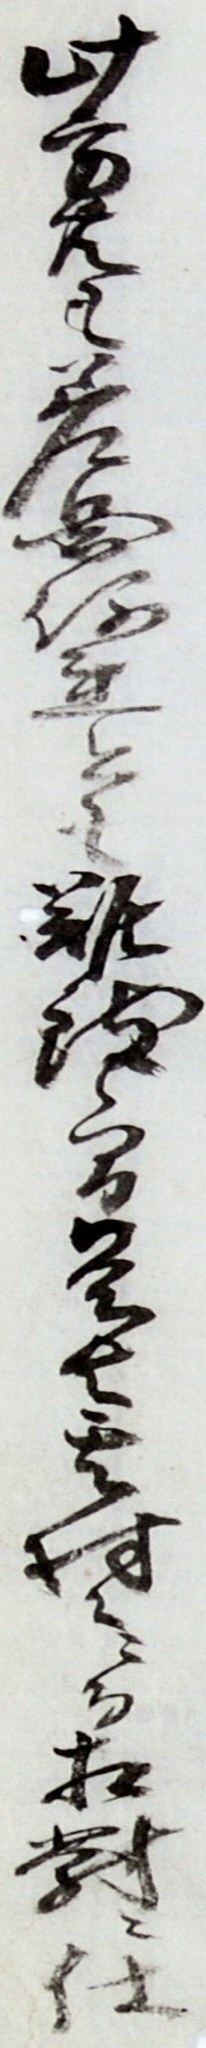此方共差図何れとも難致候間是は其村々ニ而相対ニ仕

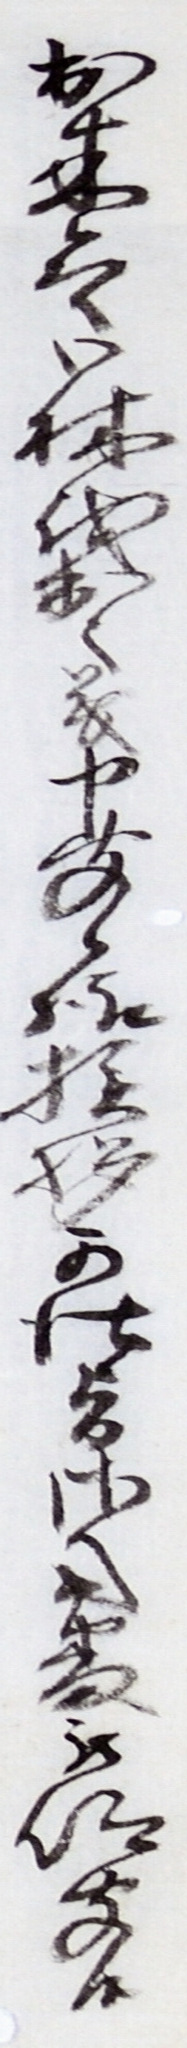出来候はゝ御林伐出之義申聞候様挨拶可仕旨御用番被仰聞候
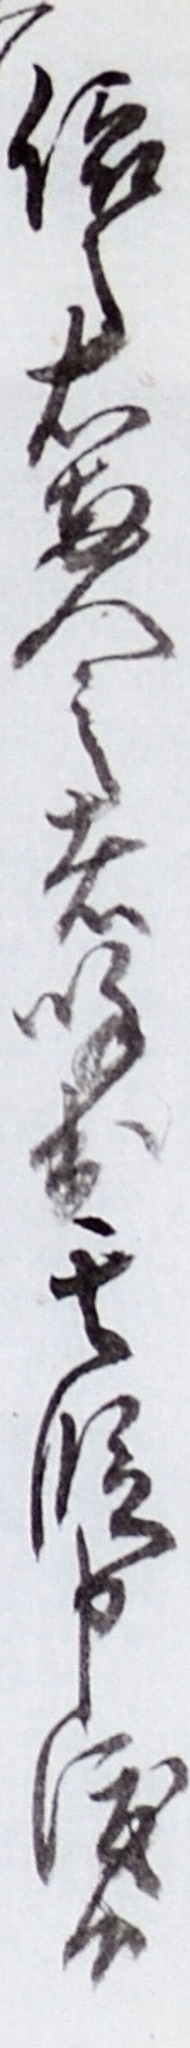依之右両人之者呼出其段申渡候
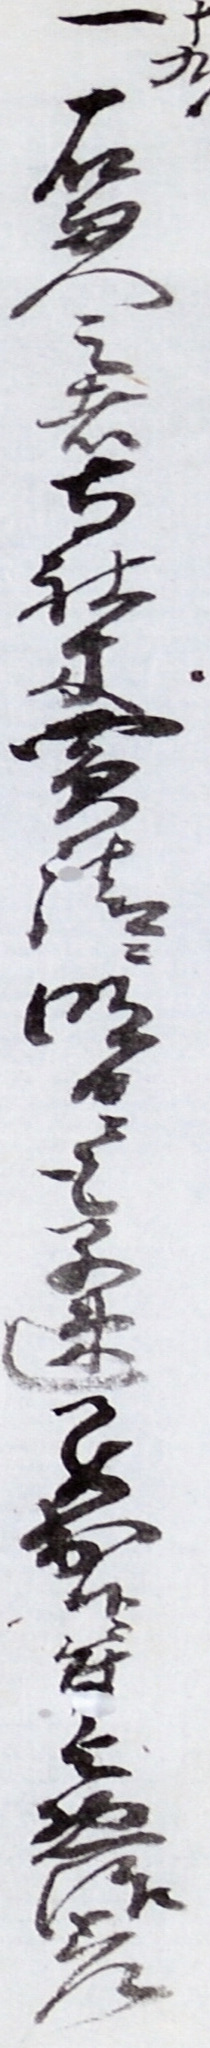一右両人之者寺社木買請ニ明日ニも早速罷出候ニ付与惣治差
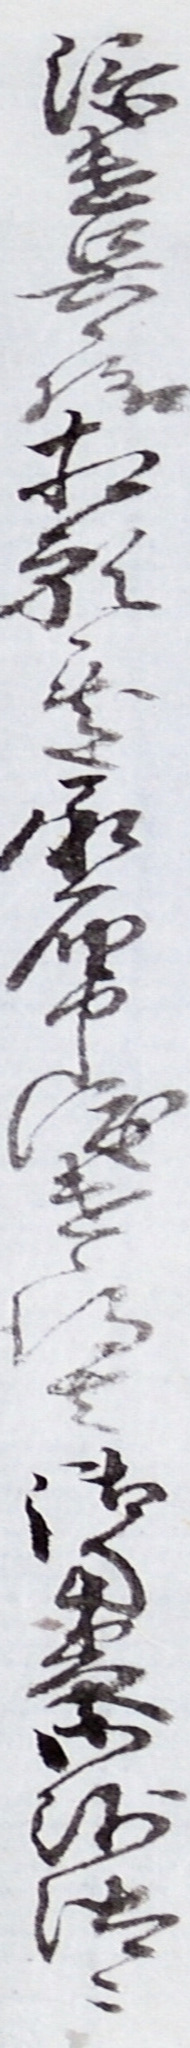添遣呉候様相願候処承届申渡遣候得は御用番御沙汰ニ
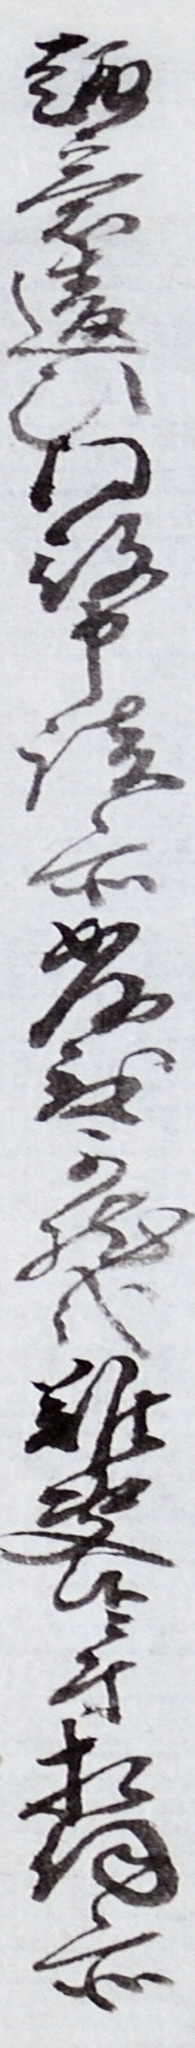趣意違ひ同役申談候所如何度可然哉難決候ニ付相伺候所
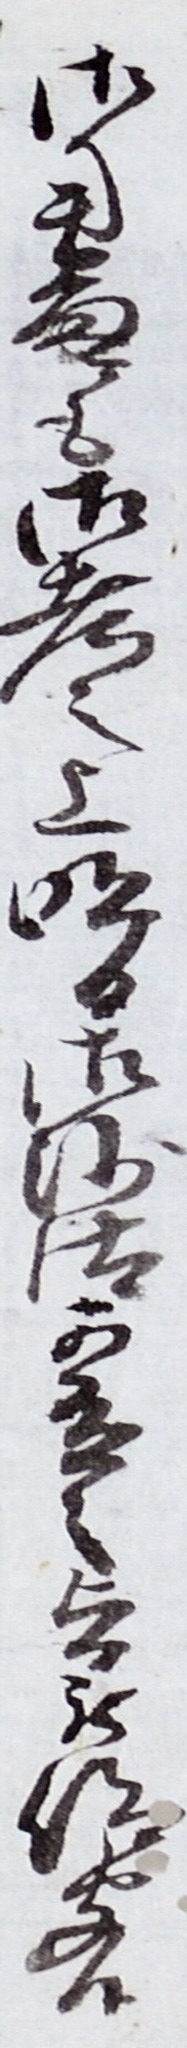御用番ニも御考之上昨日御沙汰可有之旨被仰聞候
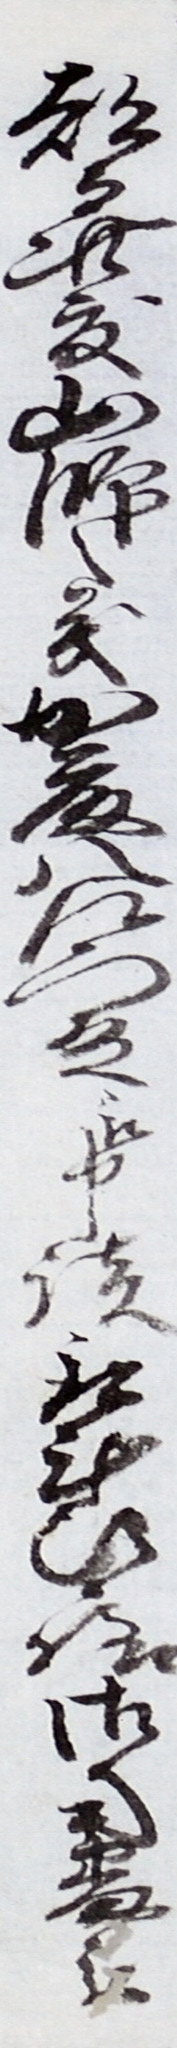一都而此度山師之義加藤八左衛門殿江申談取計ひ候様御用番被
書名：御山奉行御用控
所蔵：伊那市立高遠町図書館・合同会社AMANE
